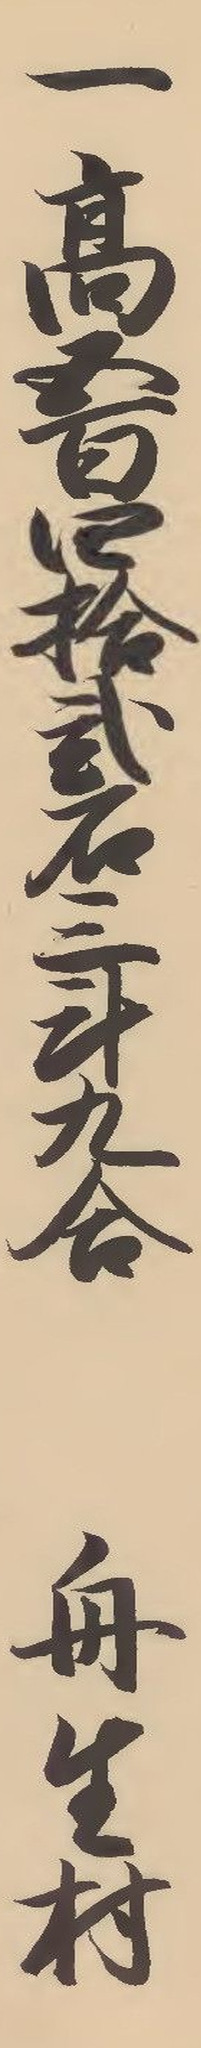一高五百四拾弐石三斗九合舟生村
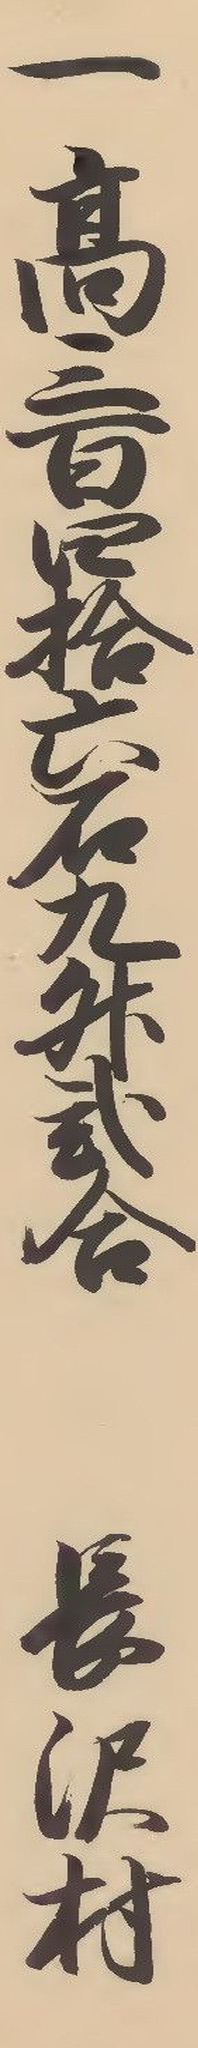一高三百四拾六石九升弐合長沢村

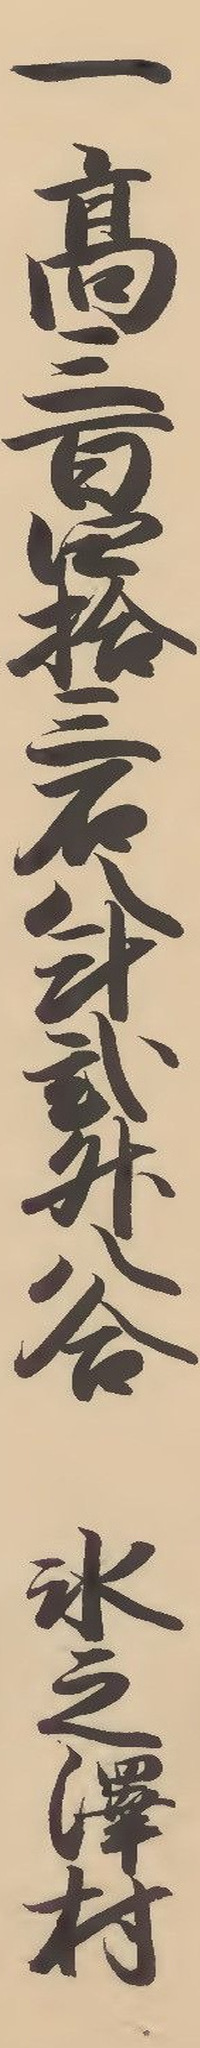一高三百四拾三石八斗弐升八合氷之沢村
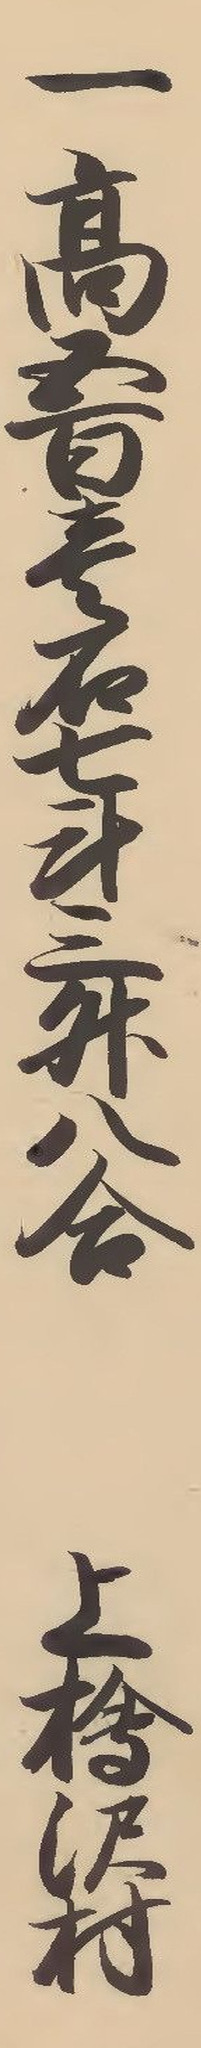一高五百壱石七斗三升八合上檜沢村
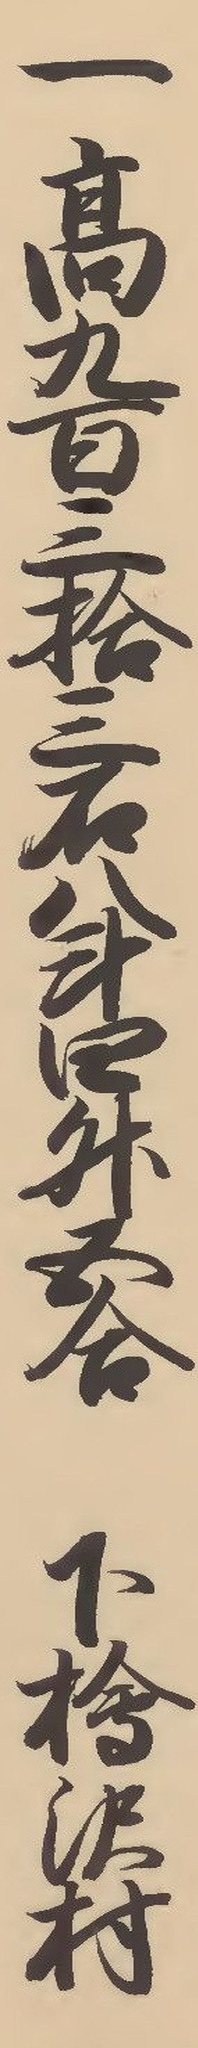一高九百三拾三石八斗四升五合下檜沢村
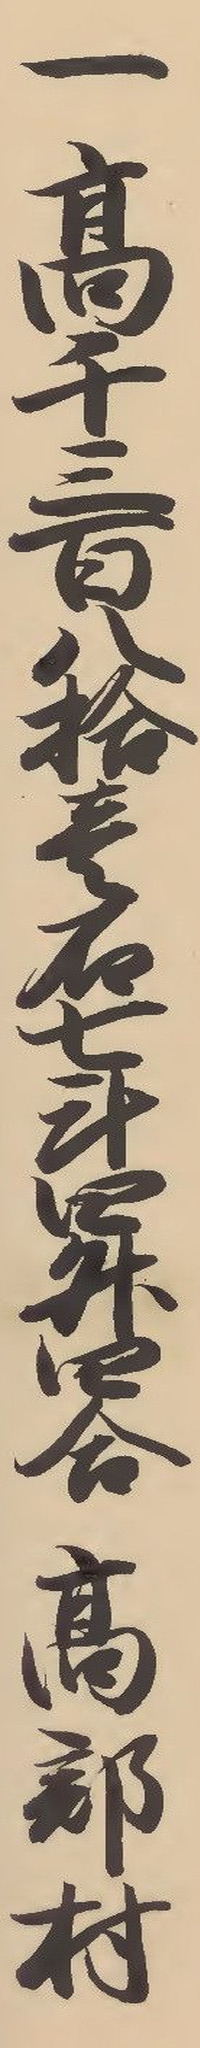一高千三百八拾壱石七斗四升四合高部村
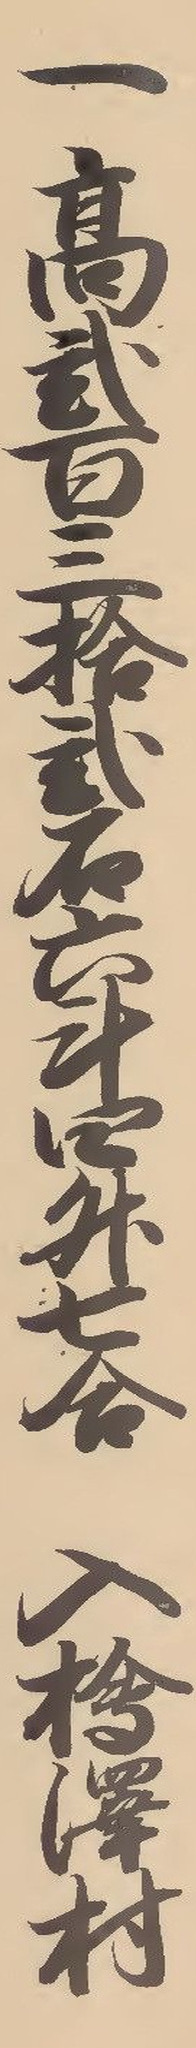一高弐百三拾弐石六斗四升七合入檜沢村
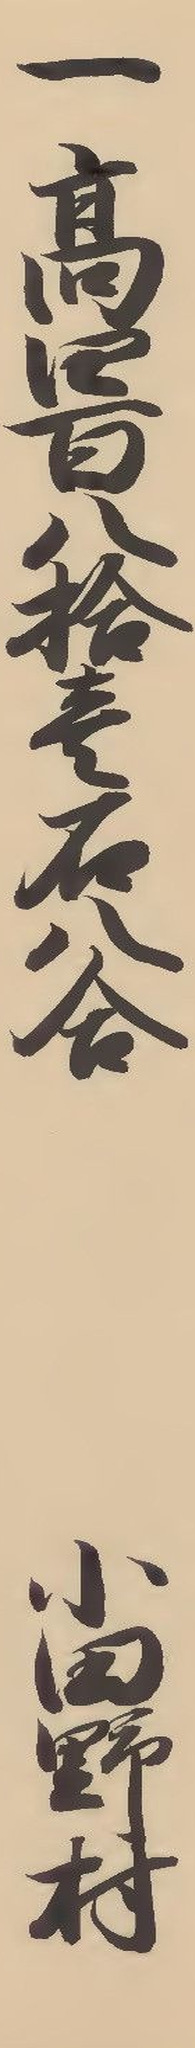一高四百八拾壱石八合小田野村
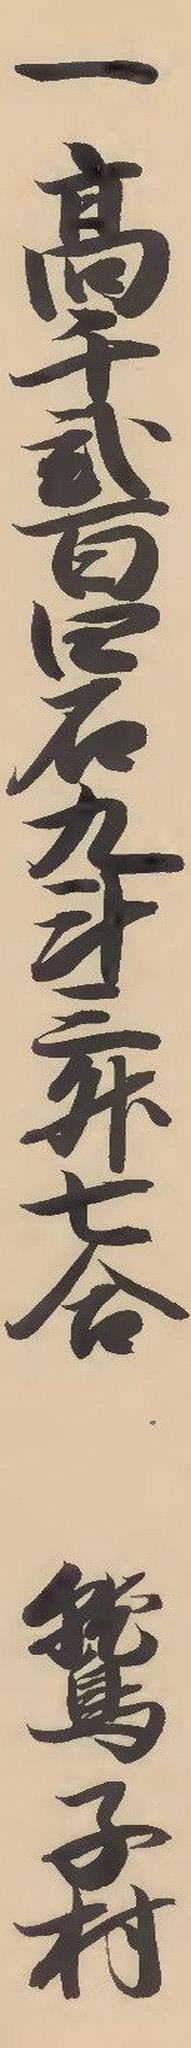一高千弐百四石九斗三升七合鷲子村
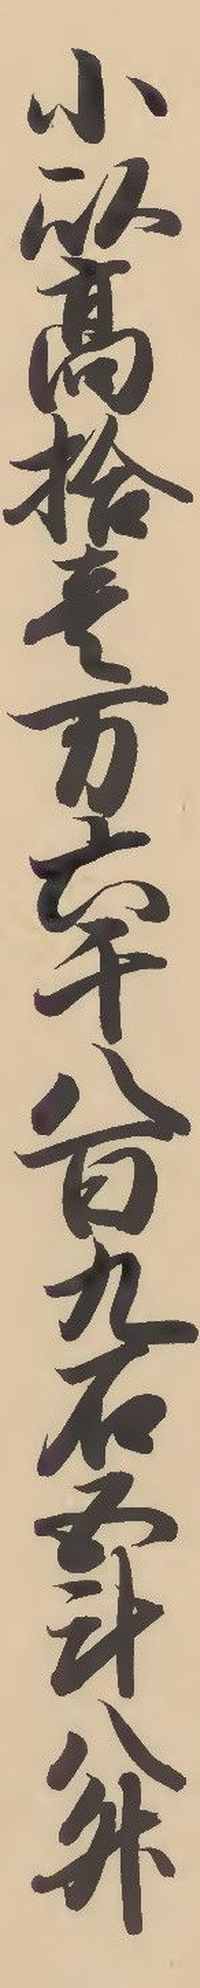小以高拾壱万六千八百九石五斗八升

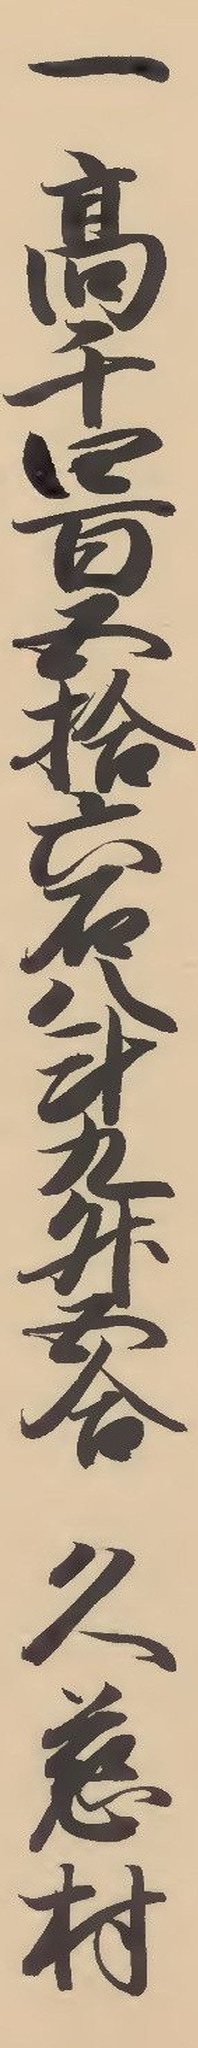一高千四百五拾六石八斗九升五合久慈村
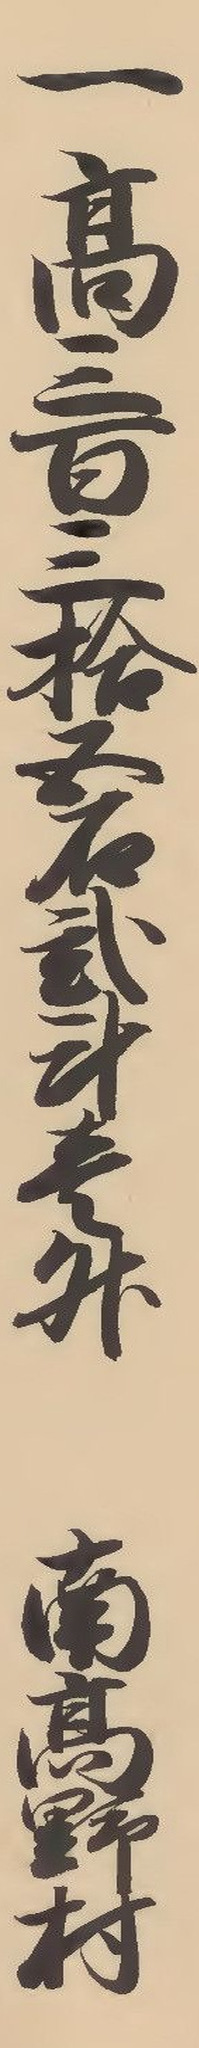一高三百三拾五石弐斗壱升南高野村
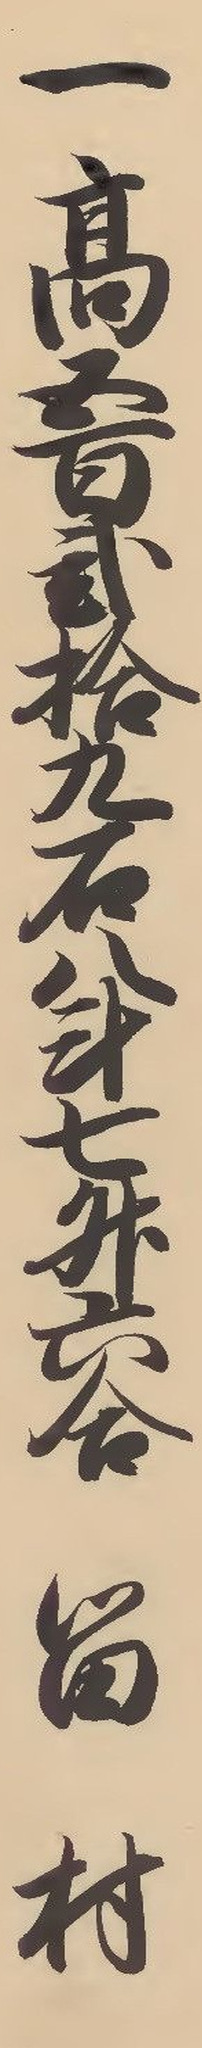一高五百弐拾九石八斗七升六合留村

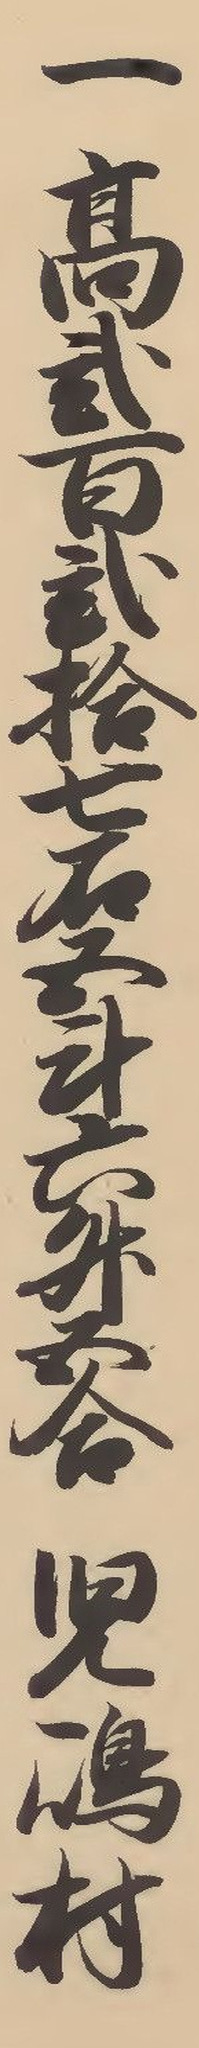一高弐百弐拾七石五斗六升五合児島村
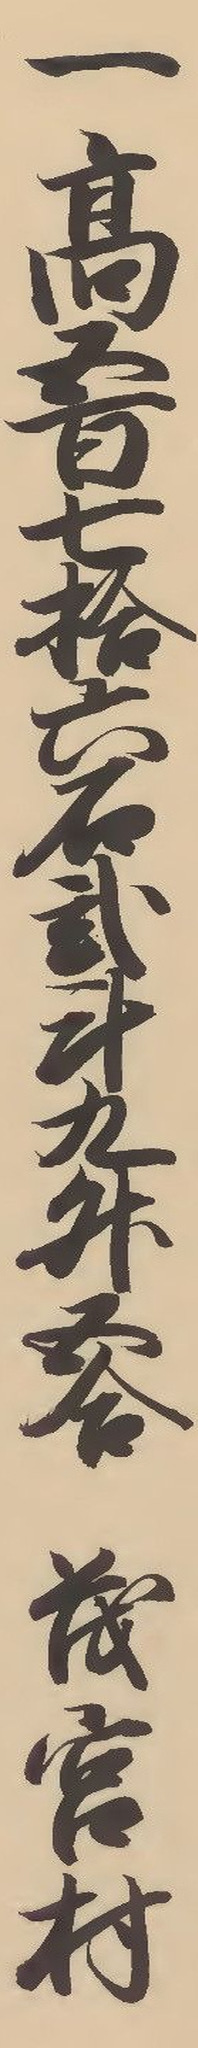一高五百七拾六石弐斗九升五合茂宮村
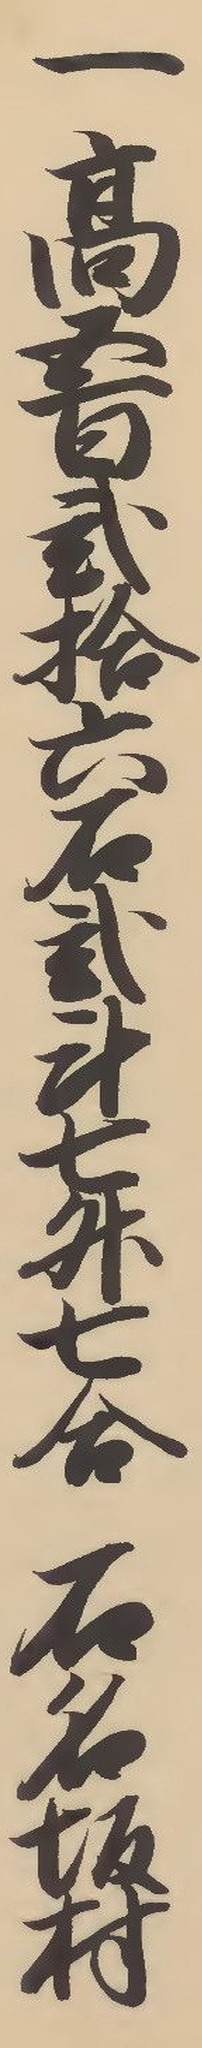一高五百弐拾六石弐斗七升七合石名坂村
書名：常陸国郷帳
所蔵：国立公文書館 National Archives of Japan
